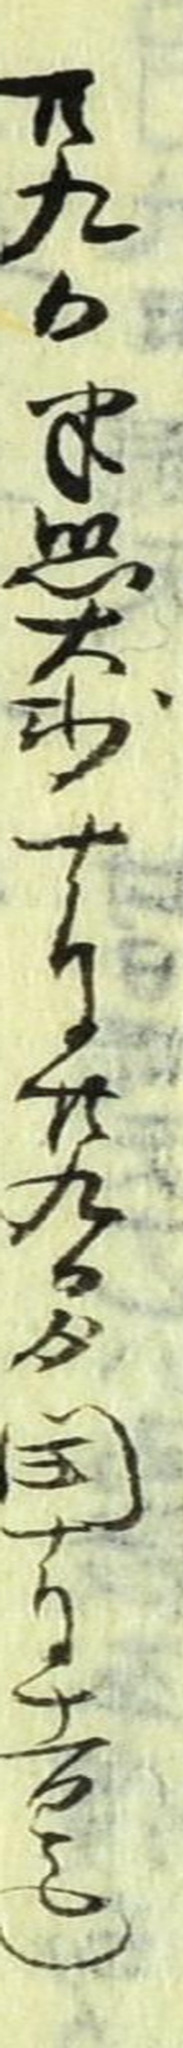廿九日半照大氷十月廿九日ゟ閏十月十一日迄
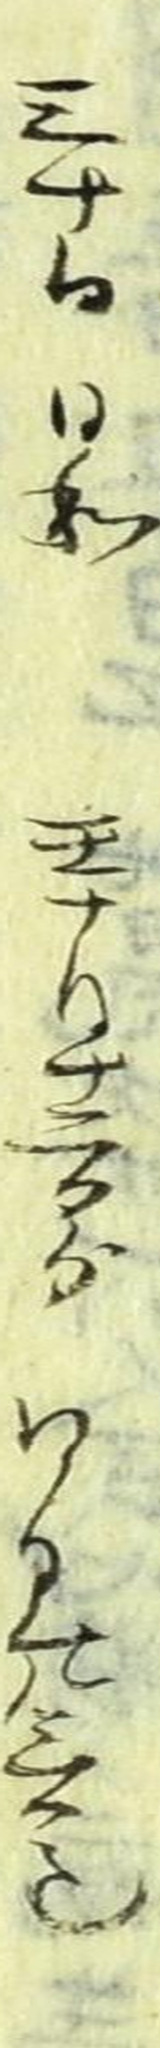三十日日和閏十月十二日ゟ同月廿三日迄
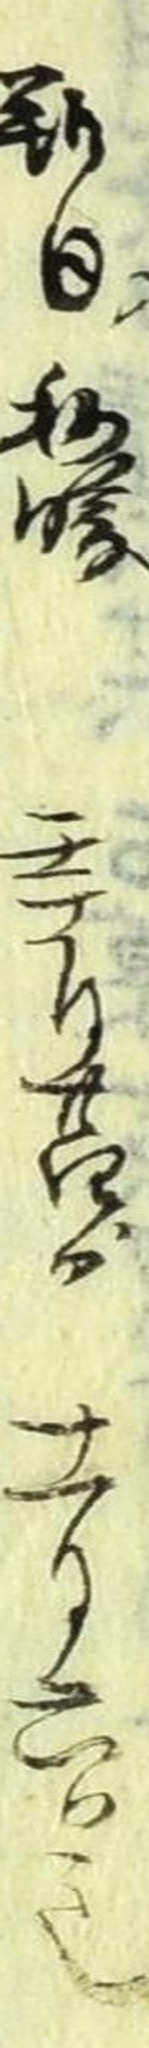朔日和暖閏十月廿四日ゟ十一月六日迄
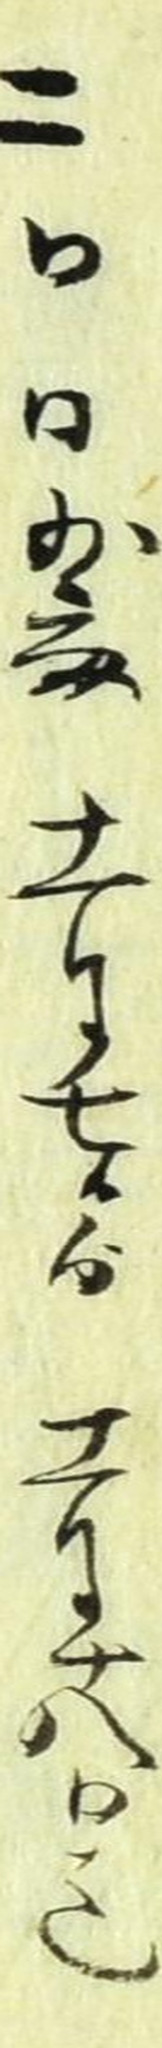二日同少雨十一月七日ゟ十一月十八日迄
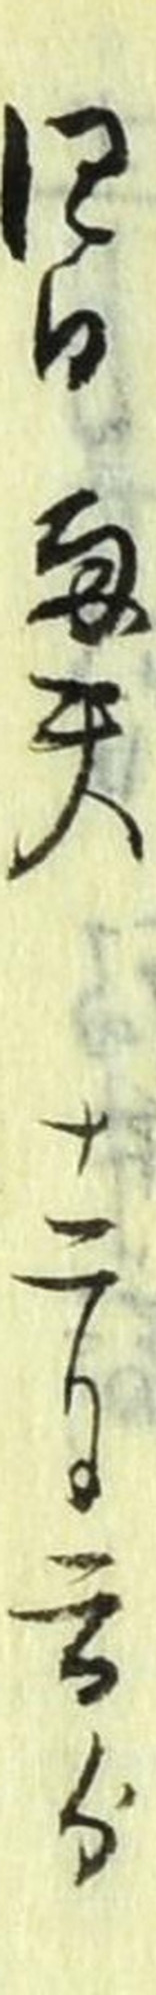四日雨天十二月二日ゟ
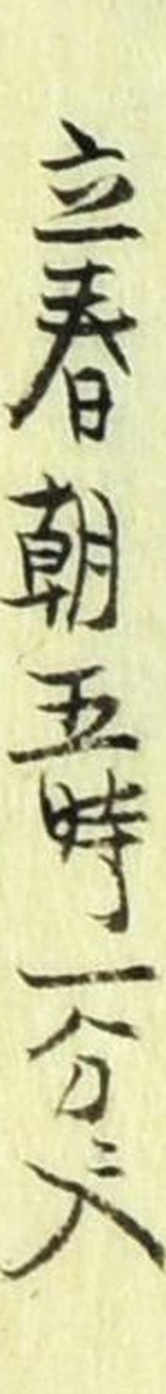立春朝五時一分に入

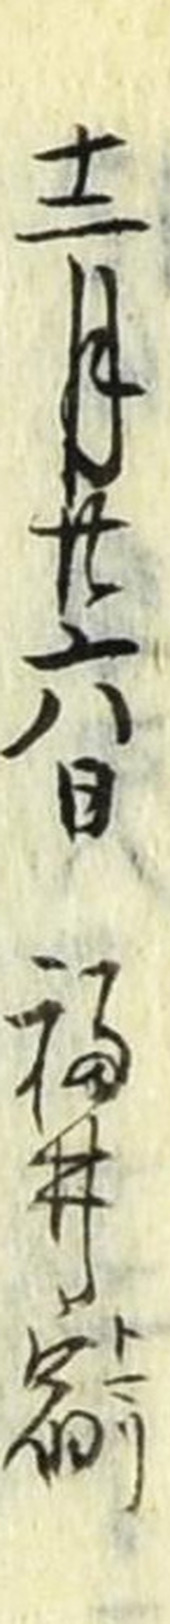十二月廿六日福井宿
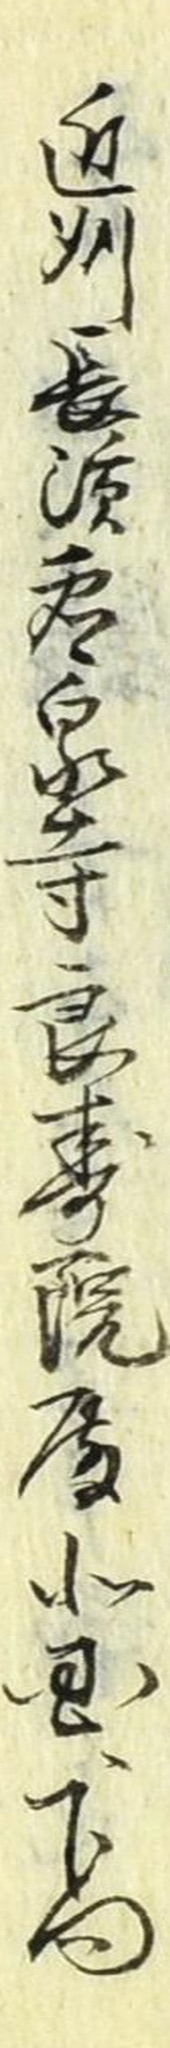近州長浜霊泉寺良寿院殿北国へ下向
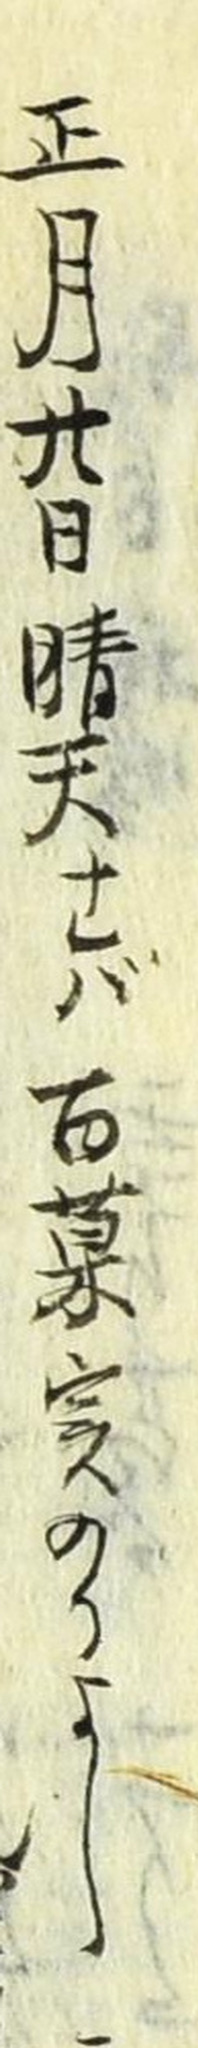正月廿日晴天なれば百菓実のりよし也
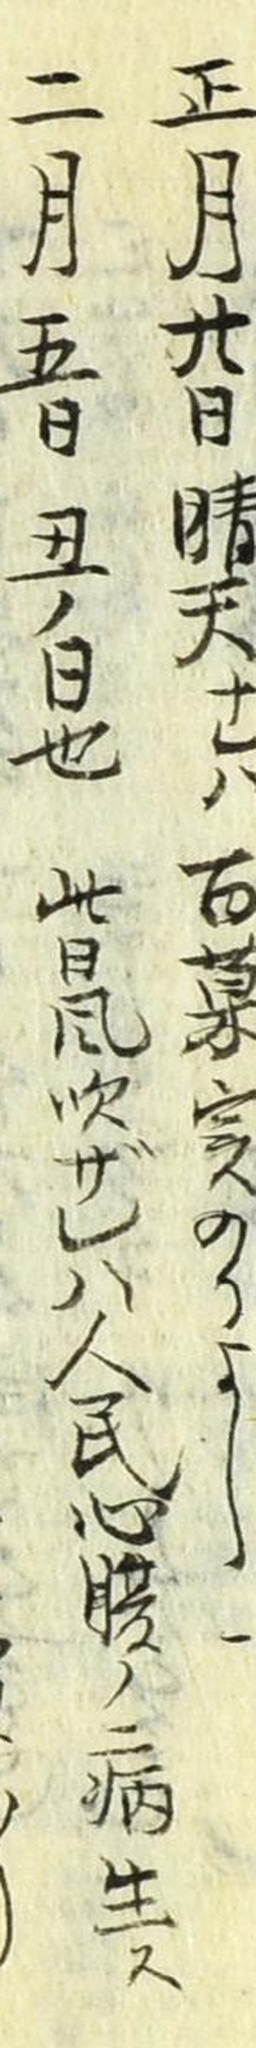二月五日丑ノ日也此日吹ざれは人民心腹の病生す
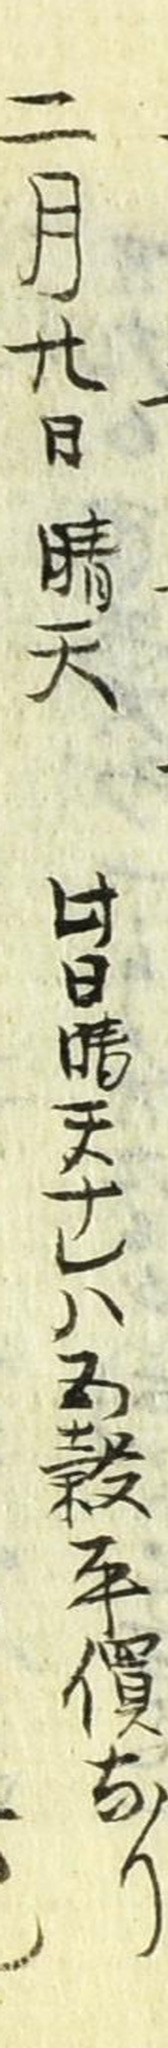二月廿日晴天此日晴天なれは五穀平価なり
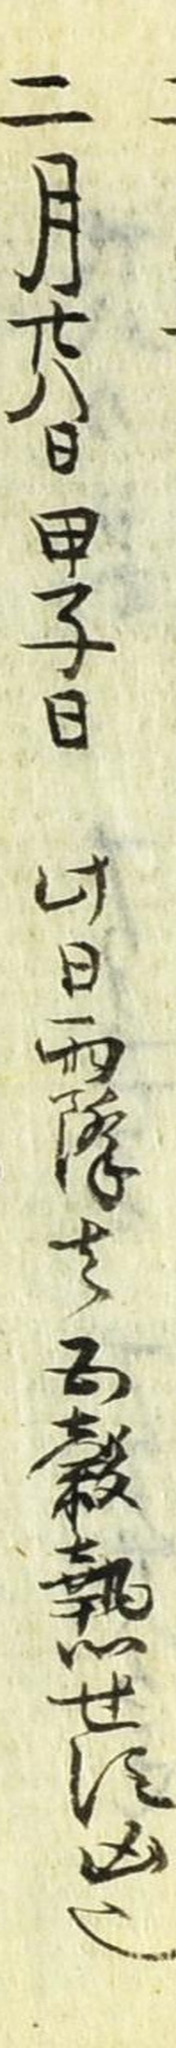二月廿八日甲子日此日雨降は五穀熱せす凶也
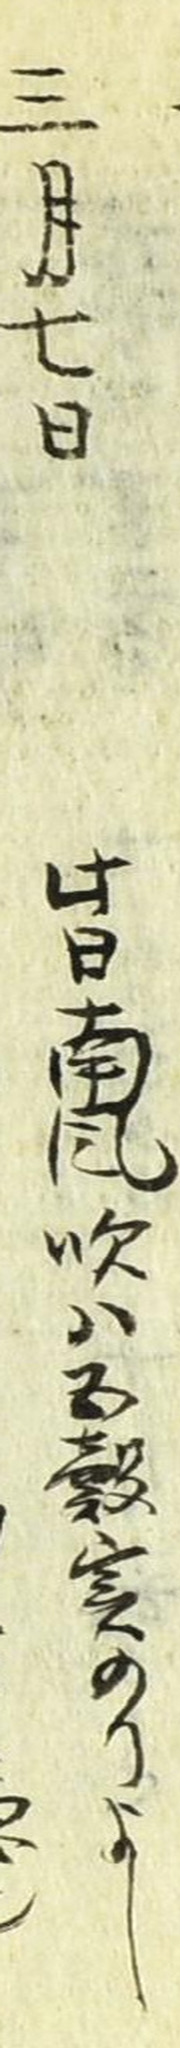三月七日此日南風吹は五穀実のりよし
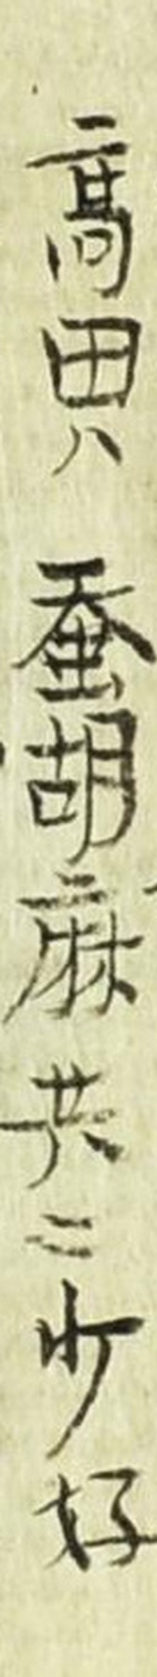高田は蚕胡麻共に少好
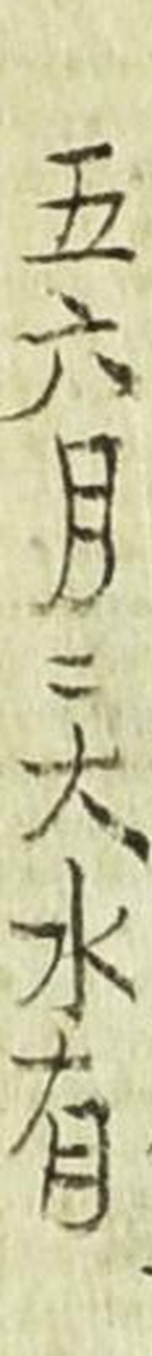五六月に大水有

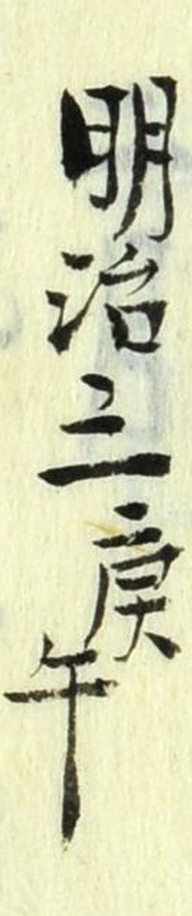明治三庚午
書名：（日記）
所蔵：福井県文書館 Fukui Prefectural Archives
